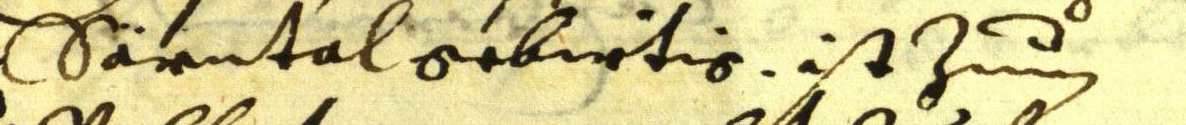Särntal gebirtig. ist Zūm
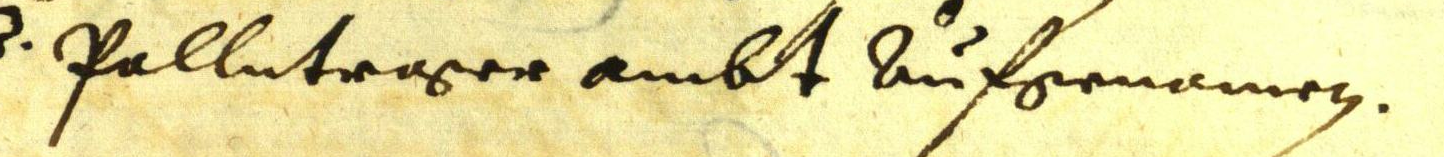Pallntrager ambt Aūfgenomen.
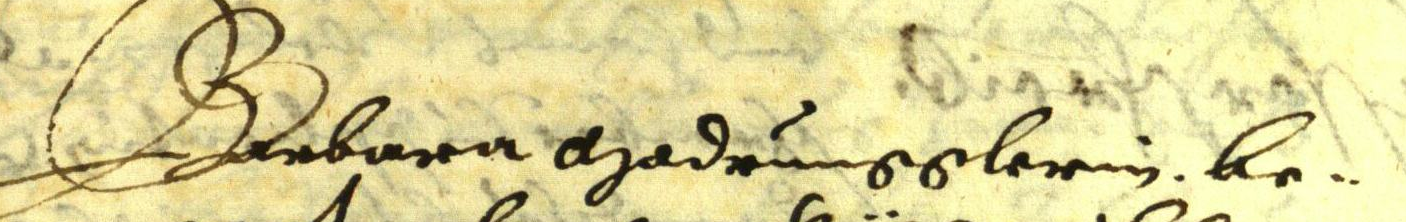Barbara Madrūngglerin. be¬
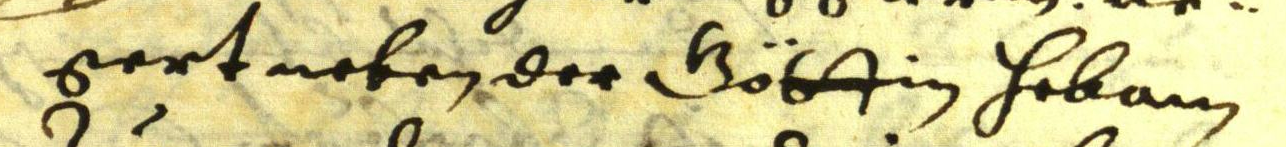gert neben der Göttin Hebam
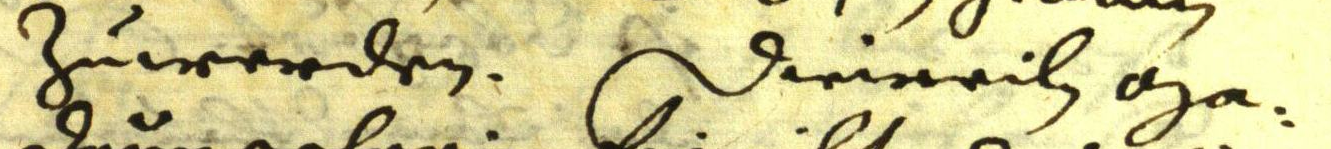Zūwerden. Dieweiln Ma¬
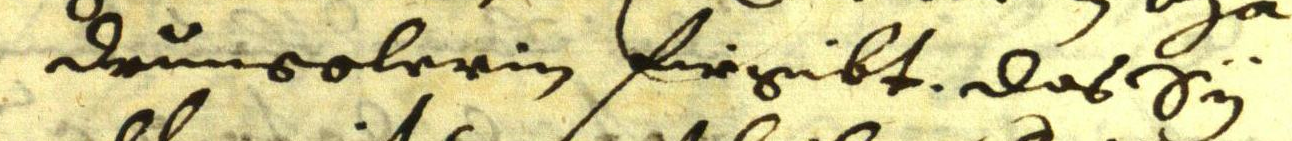drūngglerin firgibt. das Sÿ
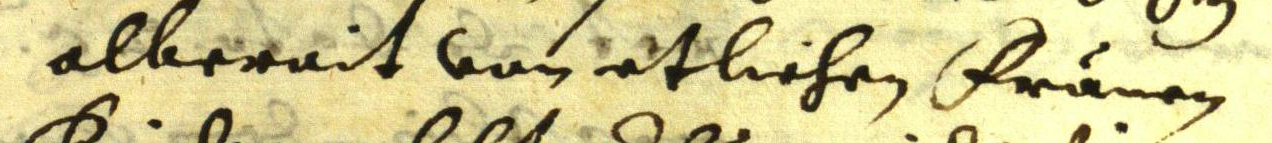alberait von etlichen Fraūen
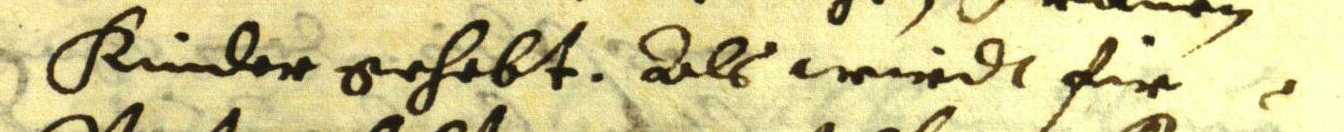Kinder gehebt. Als wirdt fir
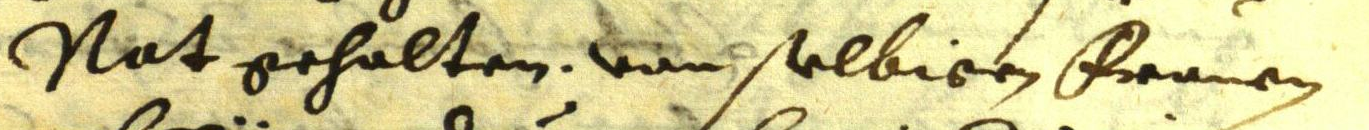Not gehalten. von selbigen fraūen
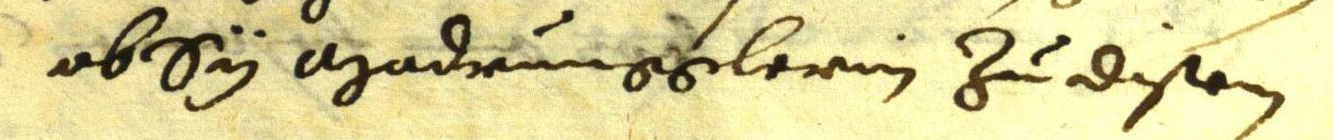ob Sÿ Madrūngglerin Zū disem
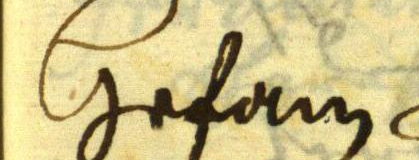Hefam.
